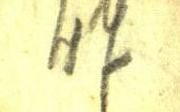47
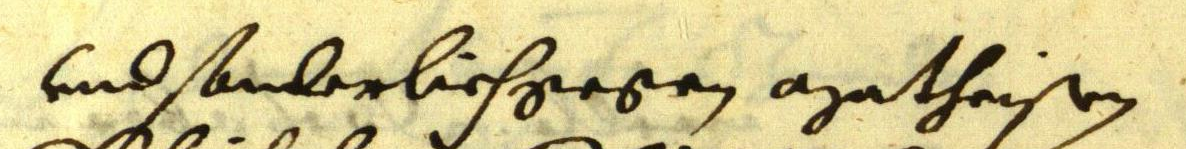vnd sonderlich gegen Matheisen
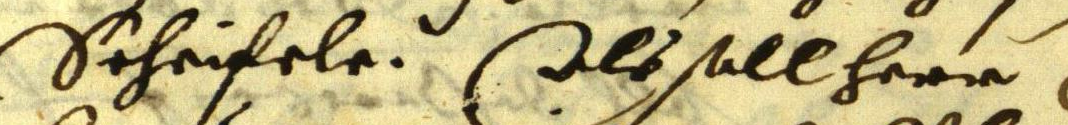Scheifele. Als soll herr
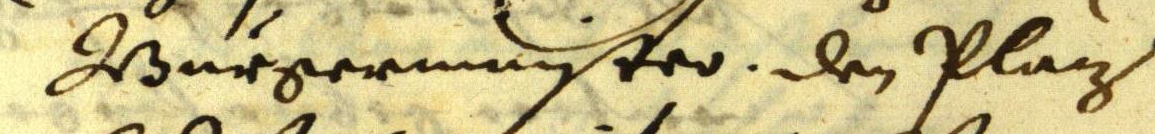Būrgermaister. den Plaz
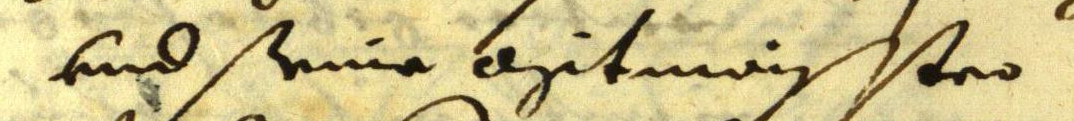Vnd seine Mitmaisster
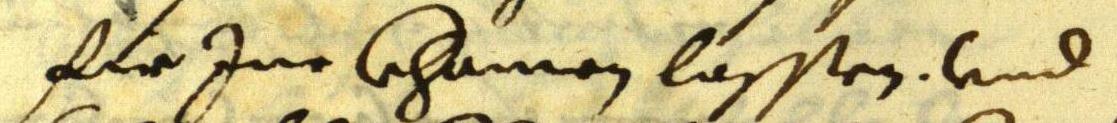fir Ine khomen lassen. vnd
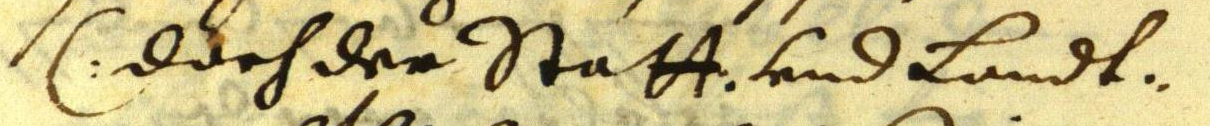(:doch der Statt: vnd Landt¬
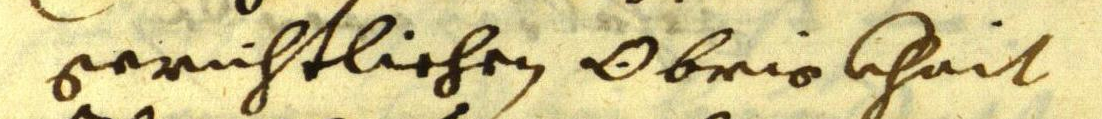gerichtlichen Obrigkhait
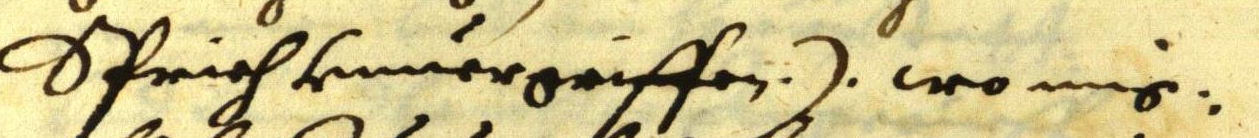Sprich vnūergriffen.). wo mig¬
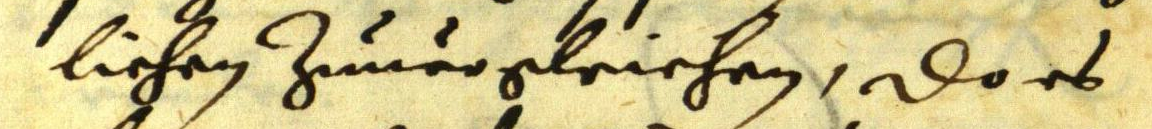lichen Zūuērgleichen, da es
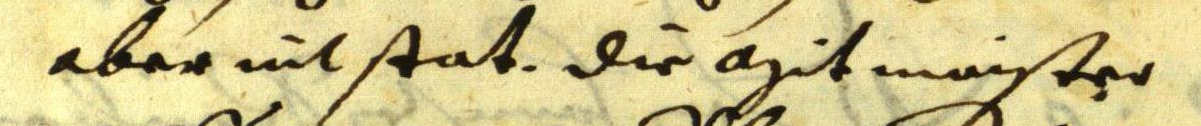aber nit stat. die Mitmaister
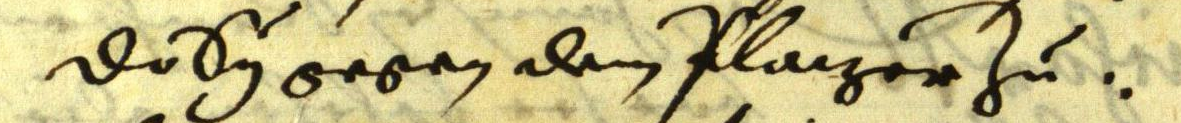da Sȳ gegen dem Plazer Zū¬
